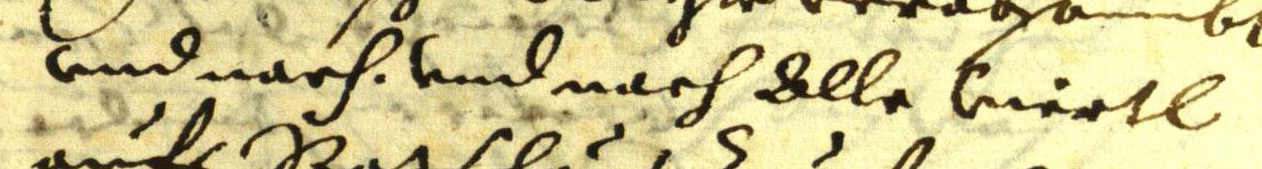vnd nach. vnd nach Alle Viertl
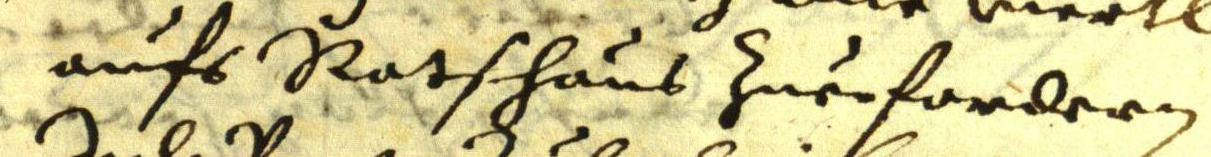aūfs Ratshaūs Zuērfordern.
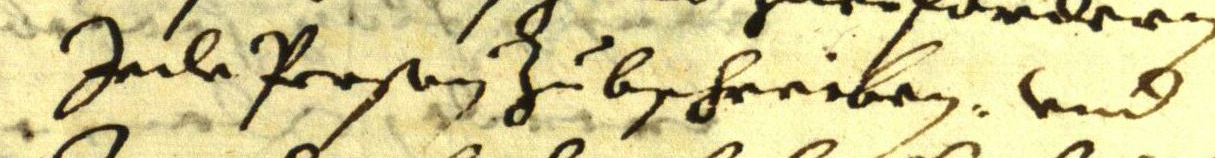Jede Person Zū bschreiben: vnd
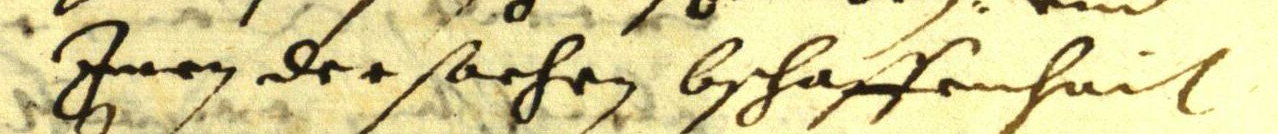Inen der sachen bschaffenhait
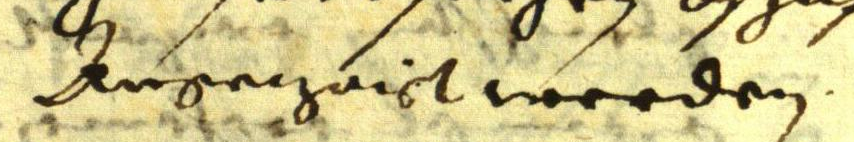Angezaigt werden.
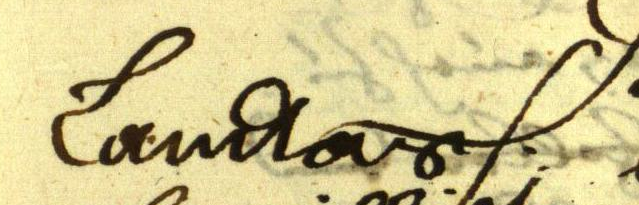Landtags.
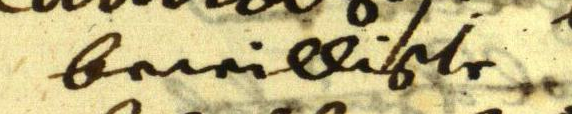bewilligte
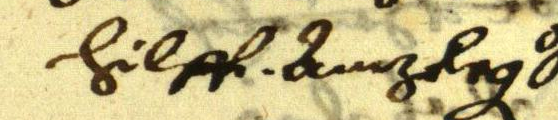hilff. Anzeleg
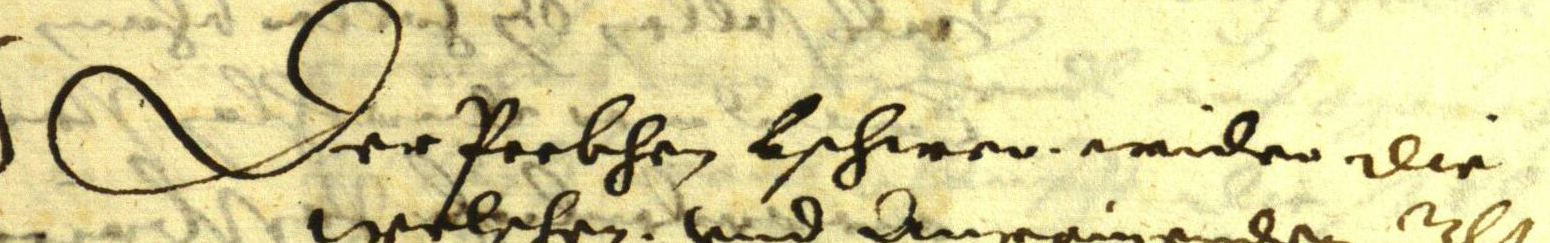Der Peckhen bschwer. wider die
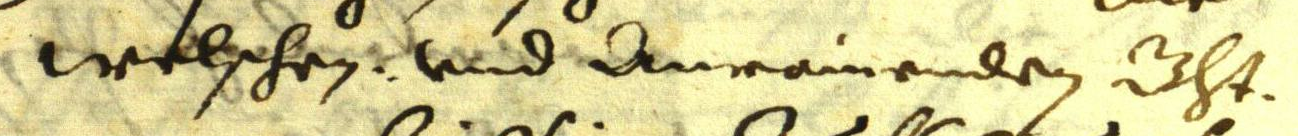welschen. vnd Anrainenden Ght.
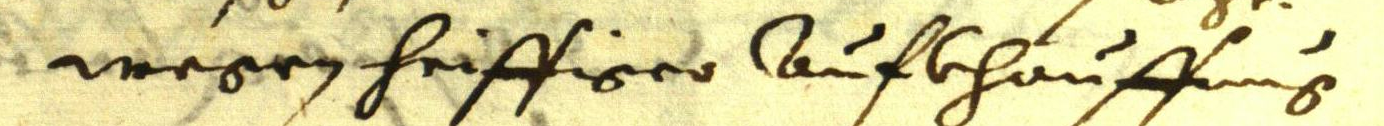wegen heiffiger Aūfkhaūffūng
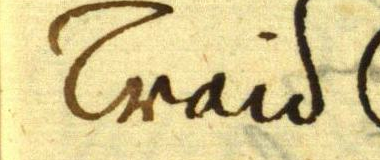Traid
